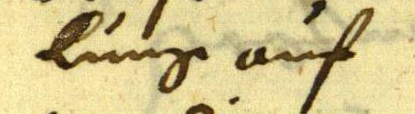lūng aūf
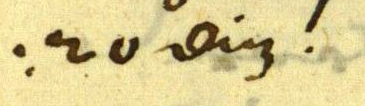:20 diz.
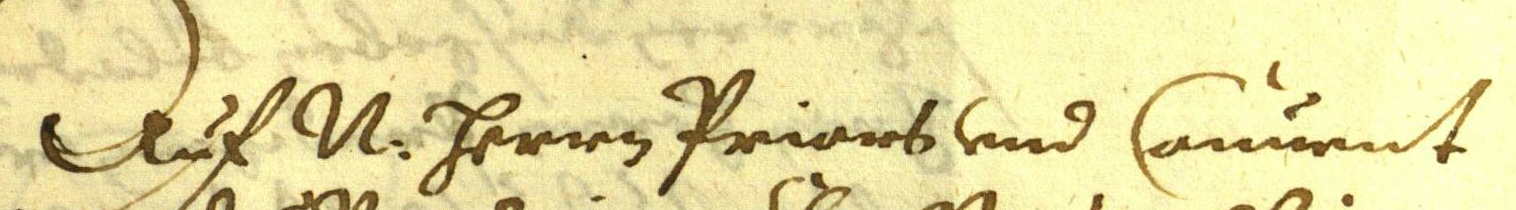Aūf N: herrn Priors vnd Conūent
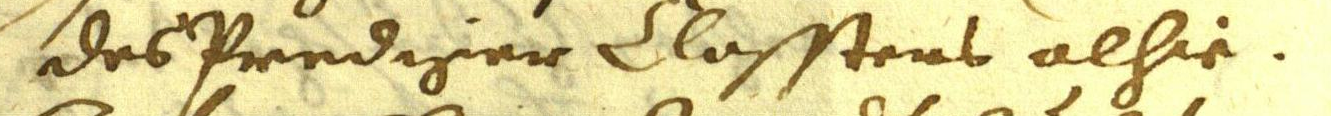des Prediger Clossters alhie.
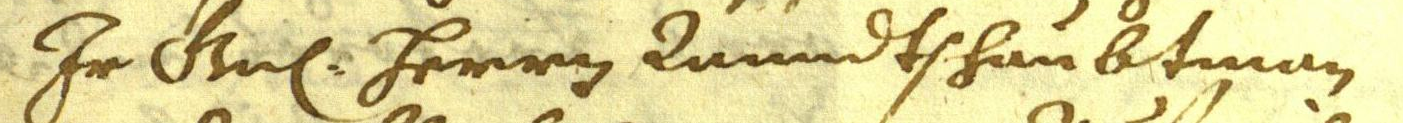Ir Gn: Herrn Lanndtshaūbtman
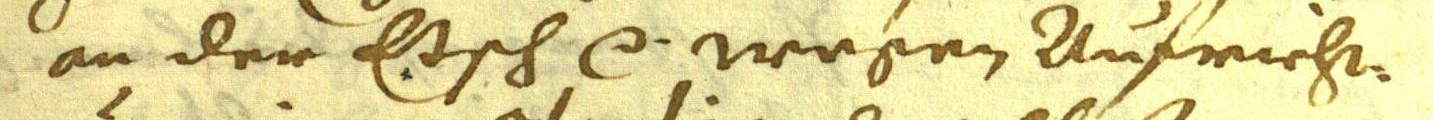an der Etsch etc. wegen Aūfricht¬
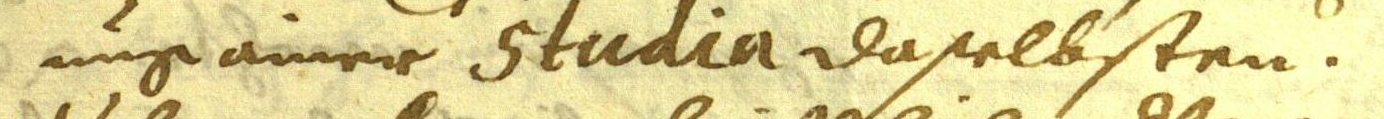ūng ainer Studia daselbsten.
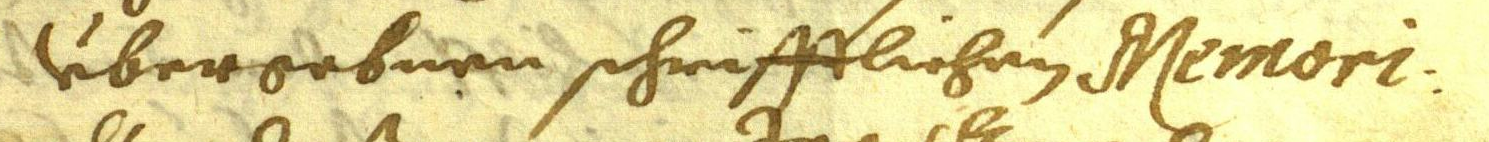v̄bergeben schrifftlichen Memori¬
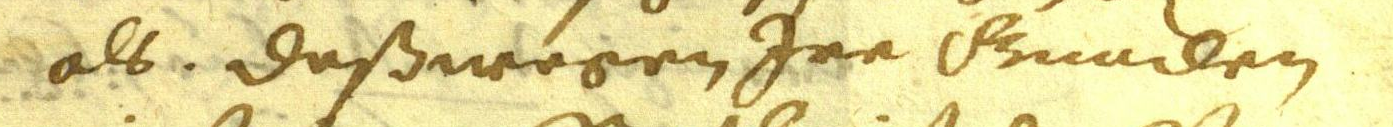als. deßwegen Ire Gnaden
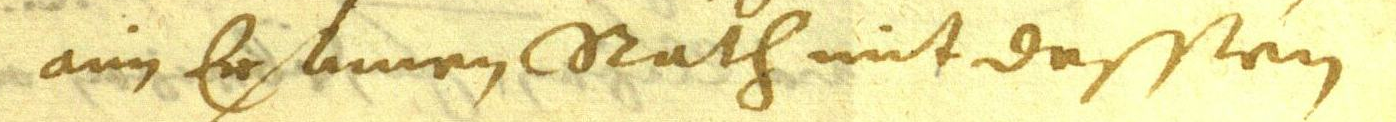aim Ersamen Rath mit dessen
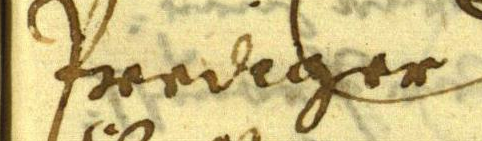Prediger
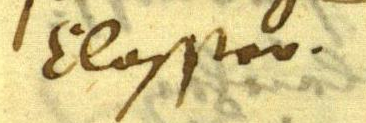Closster.
